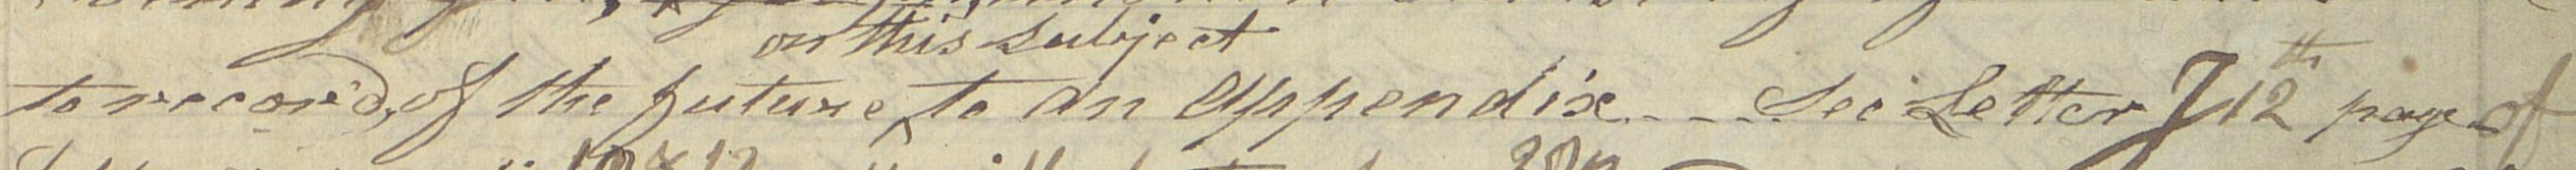to recored of the future ^ to an Appendix. See Letter J 12^th page of
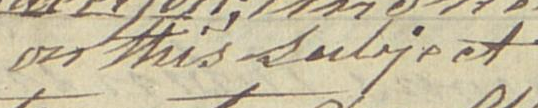on this Subject
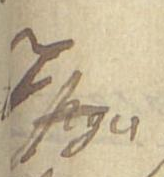pg 4
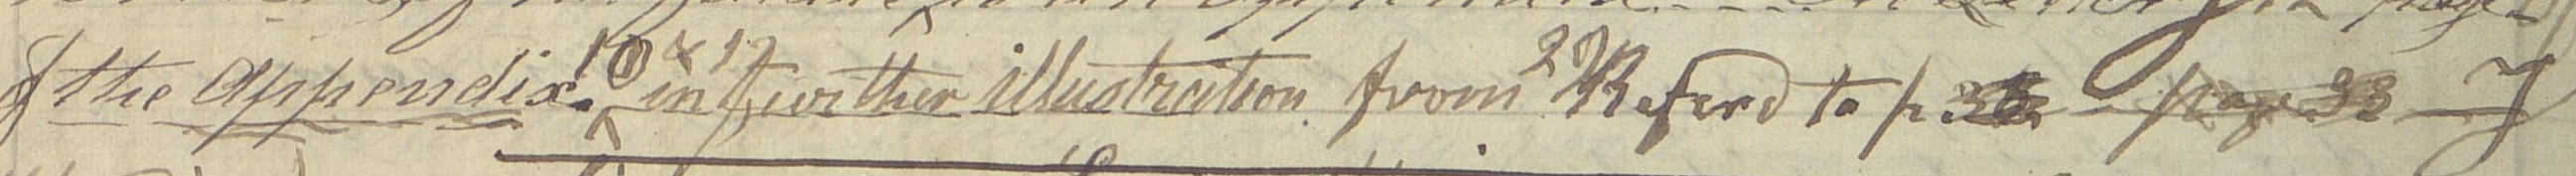of the Appendix ^ in fur the illustration from 22 Referd to p 30 Spage 33 J
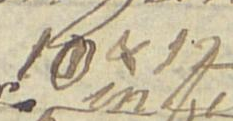10 x 12
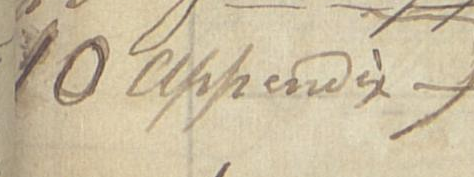10 Appendix
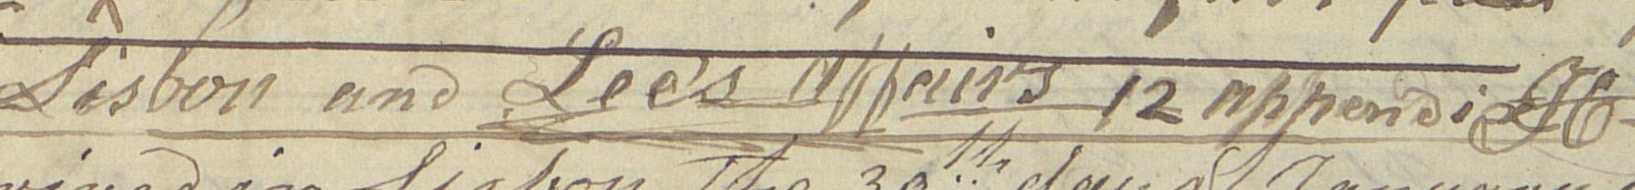Lisbo and Lee's Affairs 12 Appendix H
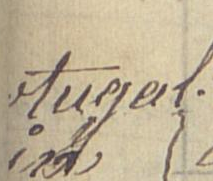-tugal
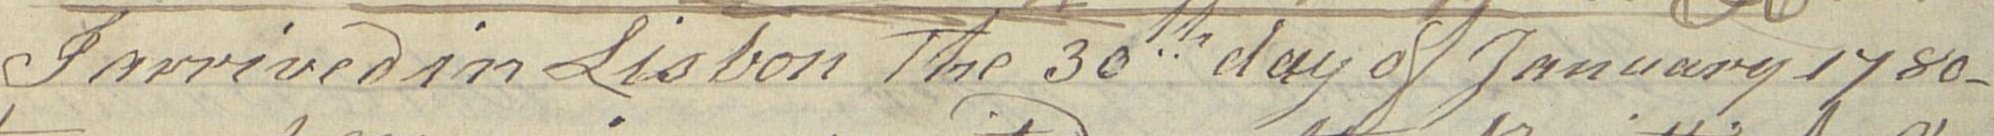I arrived in Lisbon the 30^th. day of January 1780
